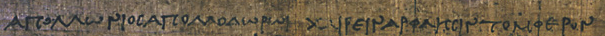απολλωνιοϲαπολλοδωρωιχαιρειναρφαηϲιντομφερον
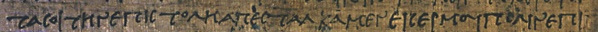ταϲοιτηνεπιϲτοληαπεϲταλκαμενειϲερμουπολινεπι
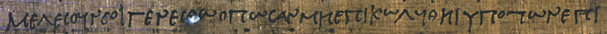μελεϲουνϲοιγενεϲθωοπωϲανμηεπικωλυθηιυποτωνεπι
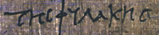τηϲφυλακηϲ
